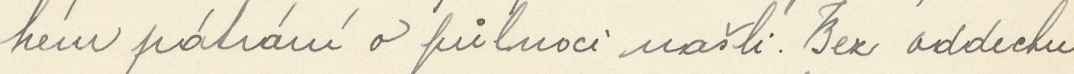hém pátrání o půlnoci našli. Bez oddechu
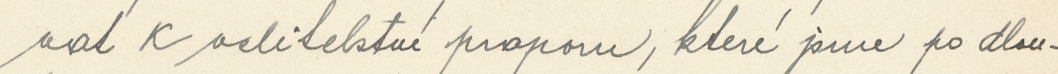vat k velitelství praporu, které jsme po dlou-
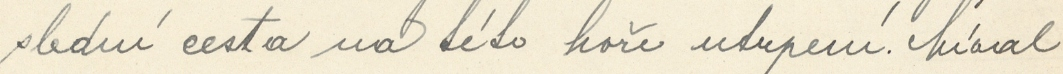slední cesta na této hoře utrpení. Míval
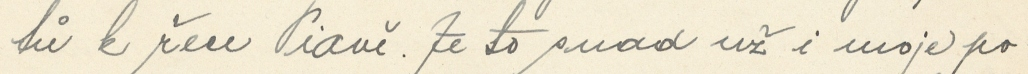tů k řece Piavě. Je to snad už i moje po-
